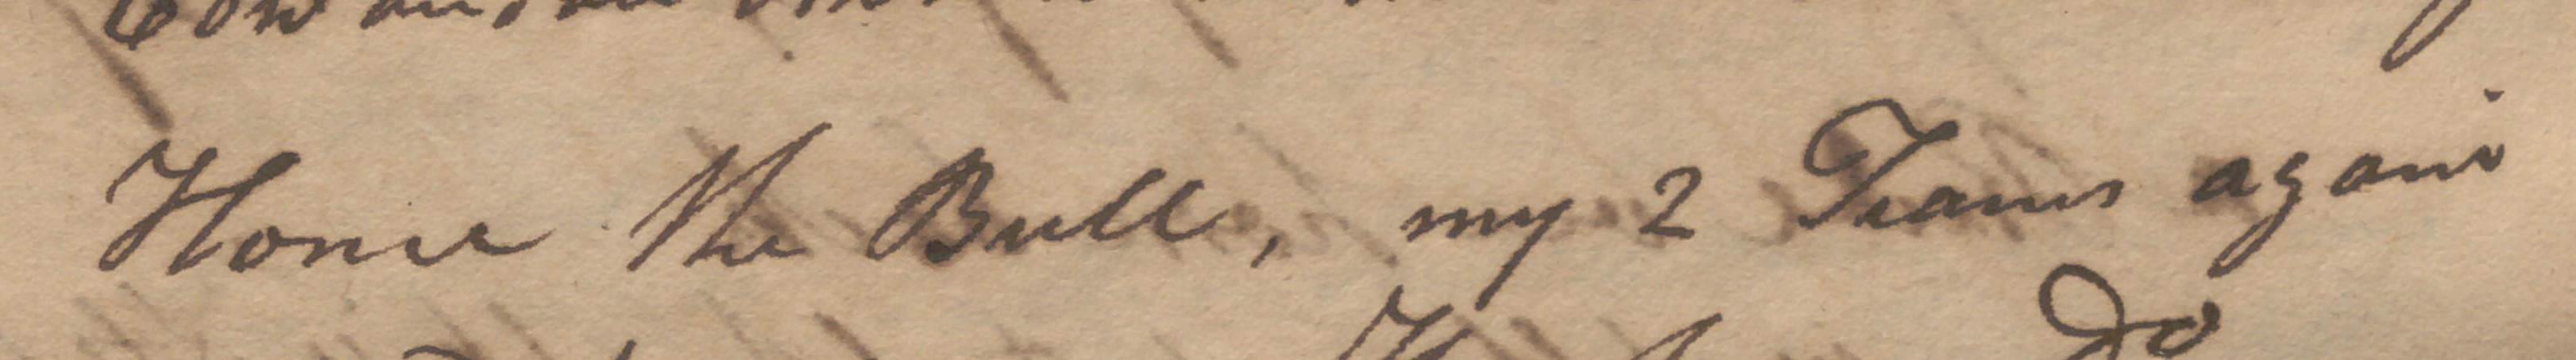Home the Bull, my 2 Teams again
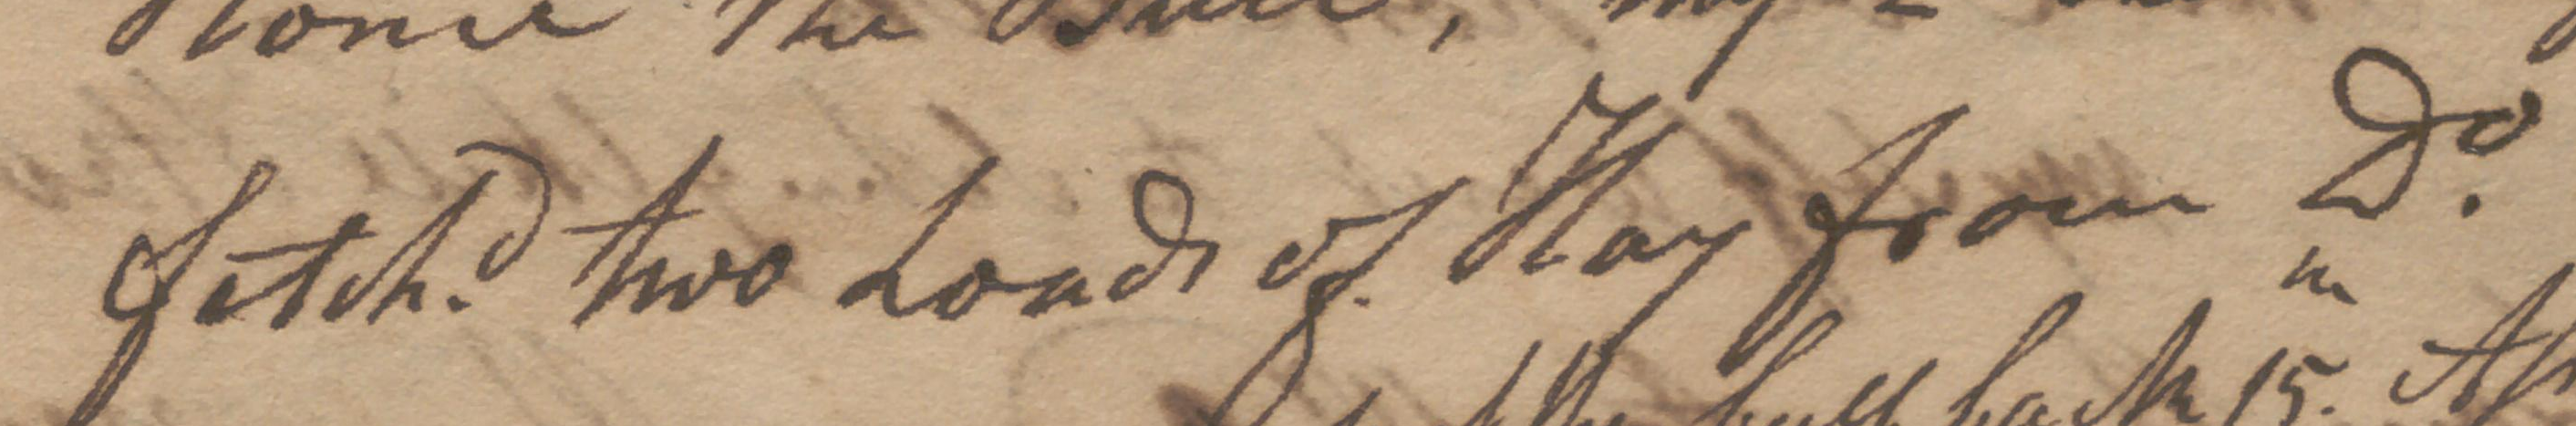fetch^d. two Loads of Hay from D^o.
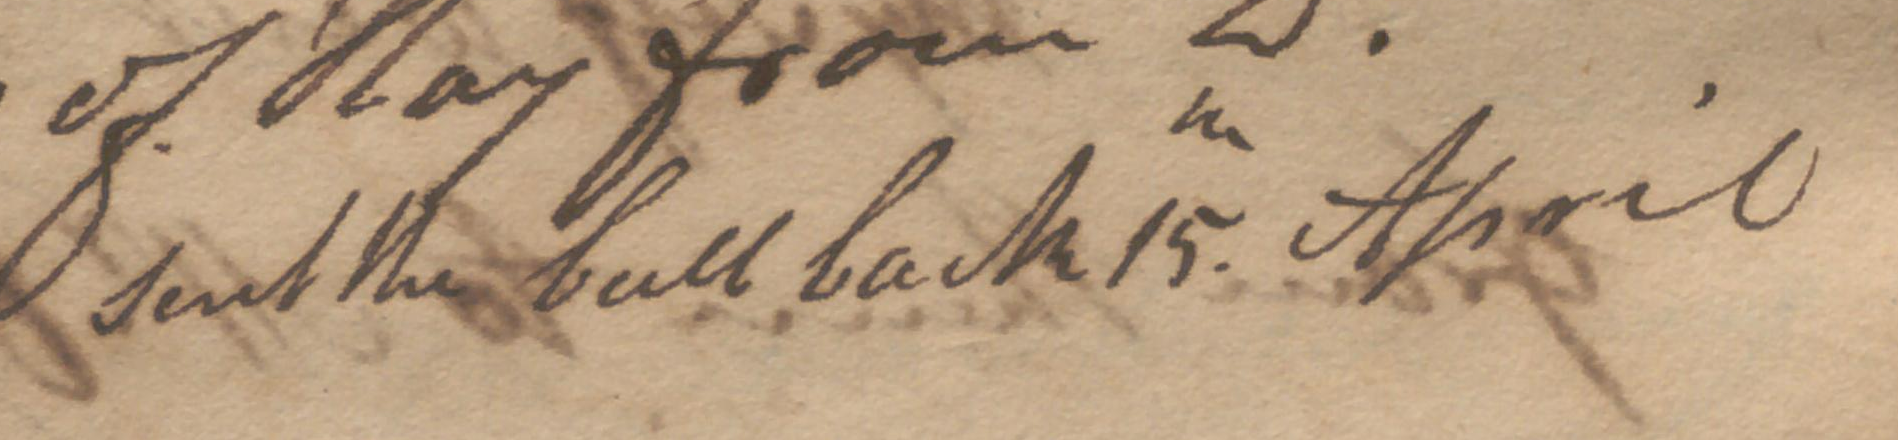sent the bull bark 15^th. April
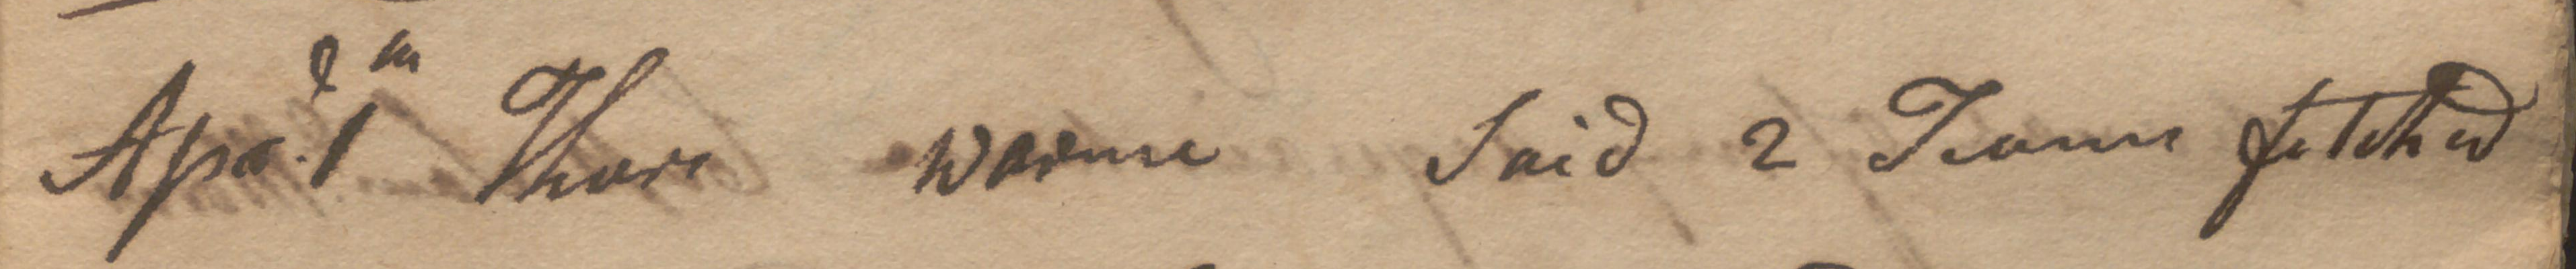Apr^l. 1^th Thurs warme said 2 Teams fetched
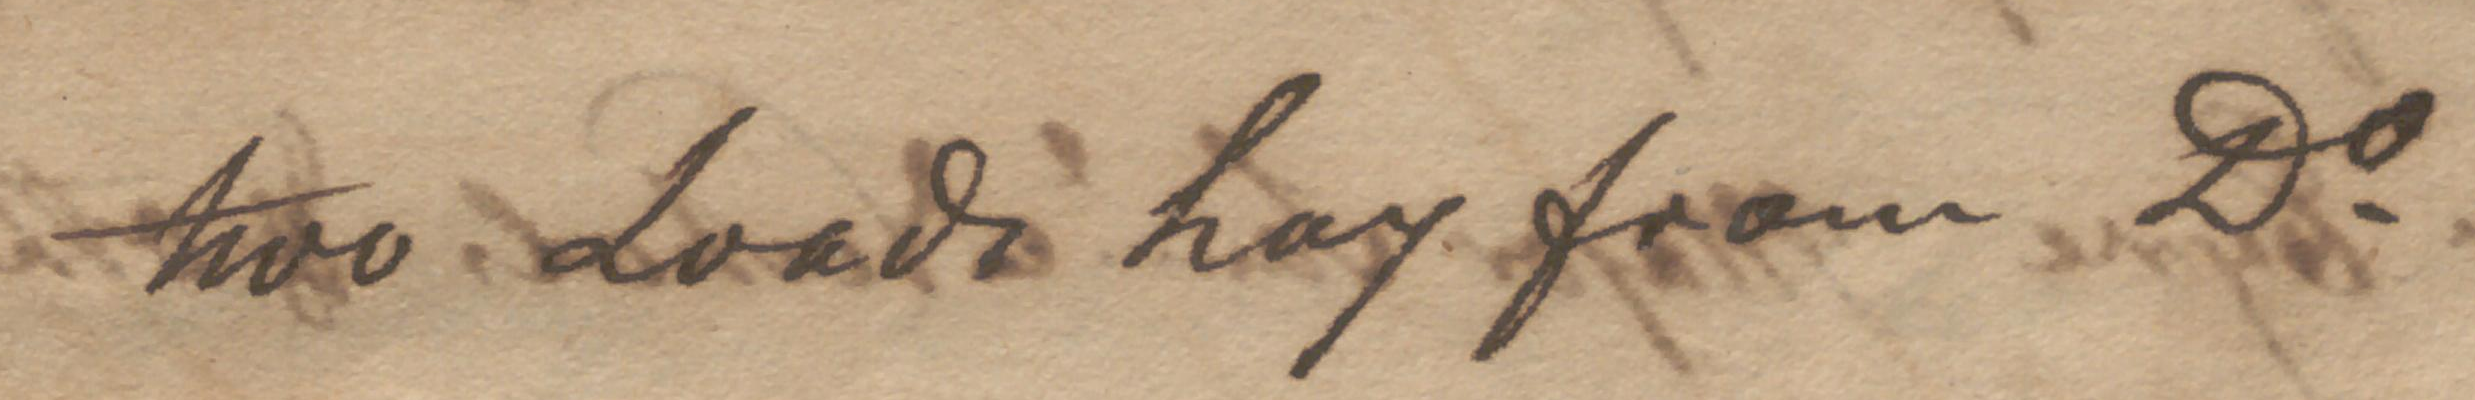two Loads hay from D^o.
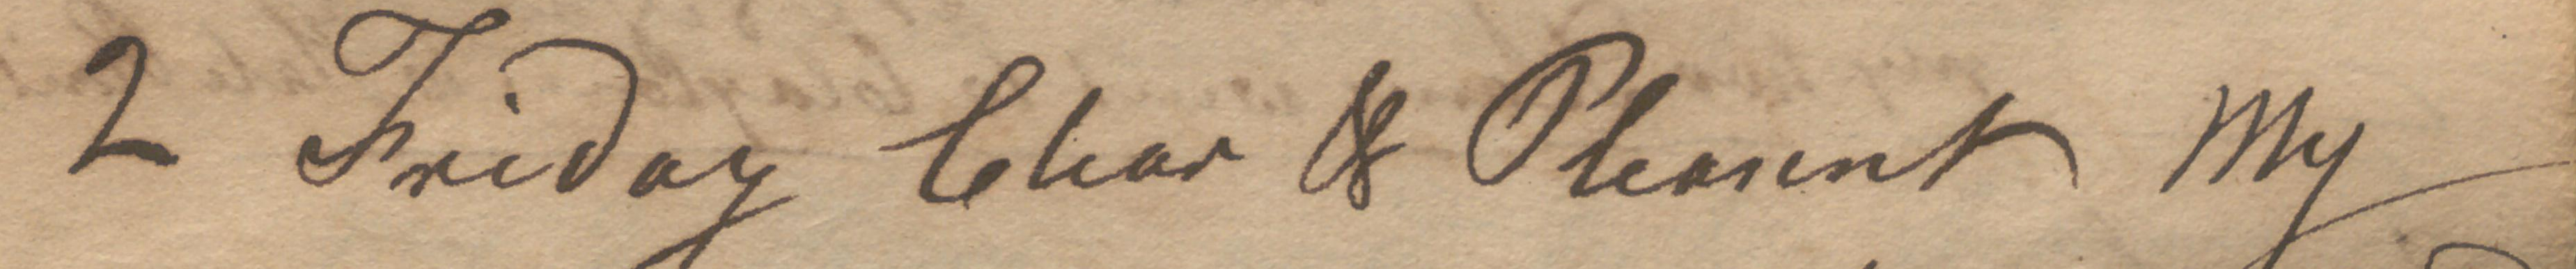2 Friday Clear & Pleasent My
